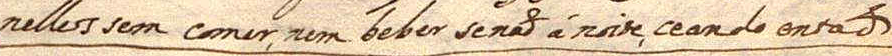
nelles sem comer, nem beber senaõ á noite, ceando entaõ
